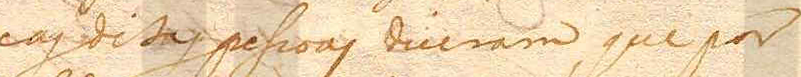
e as ditas pessoas diceram, que por
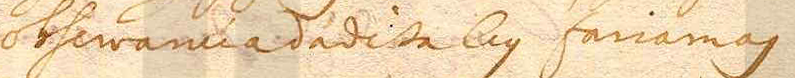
observancia da dita ley faziam as
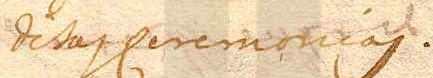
ditas Ceremonias.
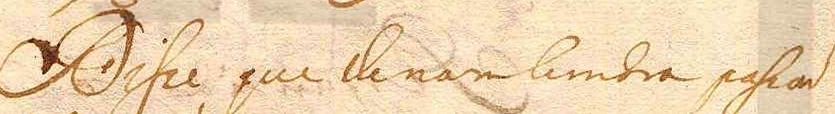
Disse, que lhe nam lembra passar
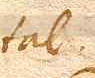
tal.
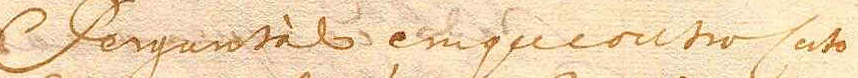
Perguntádo em que outro Certo
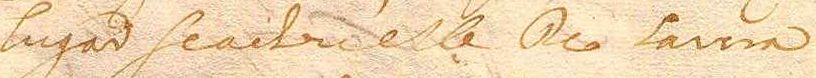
lugar se achou elle Reo havera
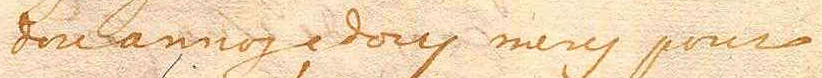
doze annos e dous mezes pouco
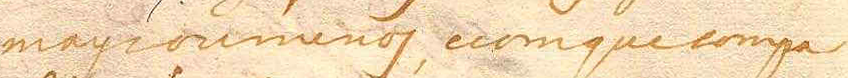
mays ou menos, e com que compa
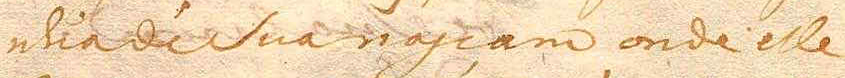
nhia de Sua nasçam, onde elle
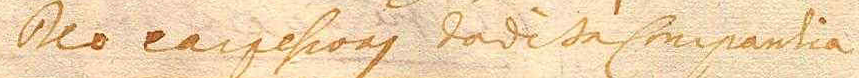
Reo e as pessoas da dita Companhia
